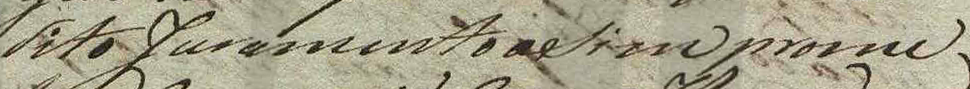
dito Juramento aSim prome
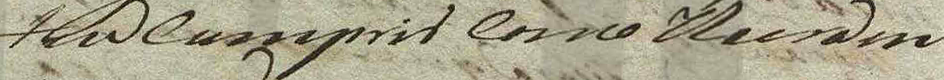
teu cumprir como lhe era en
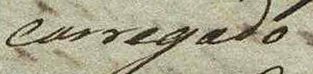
carregado
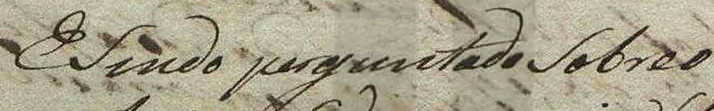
E sendo perguntado sobre o
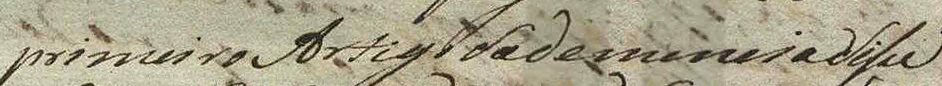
primeiro Artigo da denuncia disse
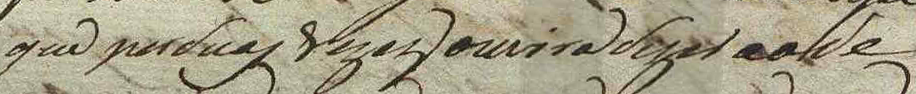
que por duas vezez ouvira dizer ao de
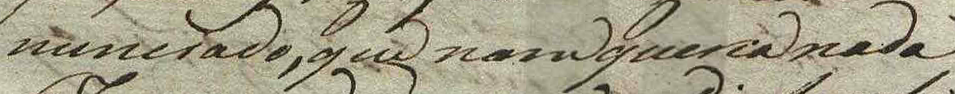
nunciado, que nam queria nada
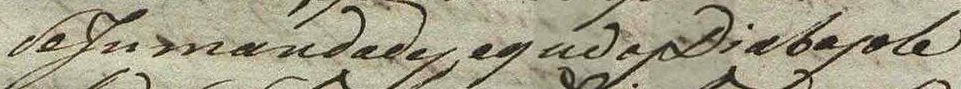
de Jrmandades, e que os Diabos o le
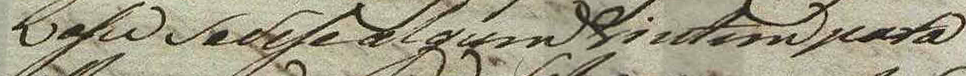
vasse se dese algum Vintem para
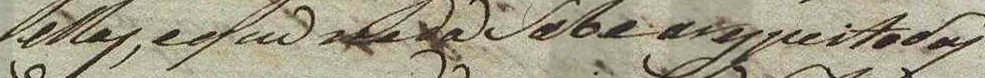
ellas, e que nada sabe a respeito das
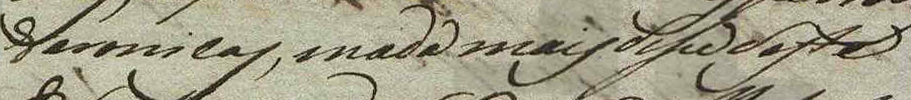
Veronicas, e nada mais disse deste
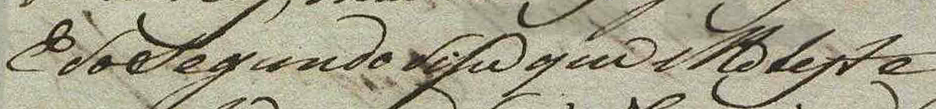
E do Segundo disse que elle teste
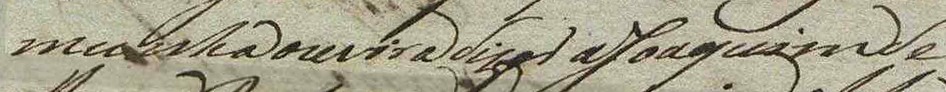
munha, ouvira dizer a Joaquim de
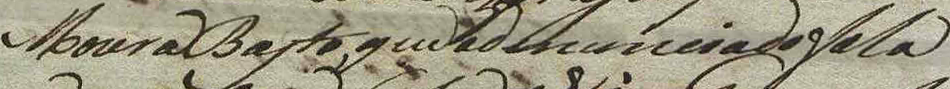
Moura Basto, que o denunciado fala
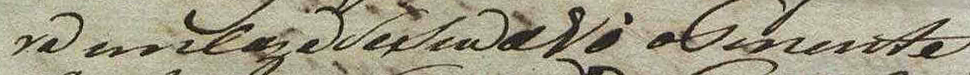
ra em caza de seu aVó o Tenente
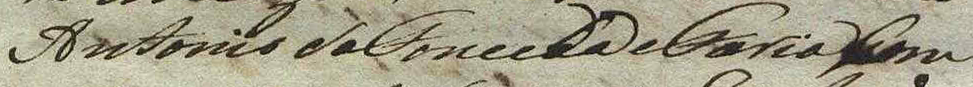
Antonio da Fonceca e Faria Com
